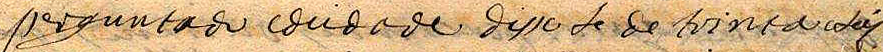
perguntado e de idade disse se de trinta e seis
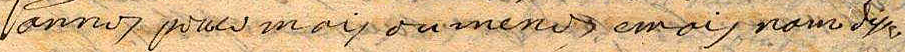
annos pouco mais ou menos e mais nam disse
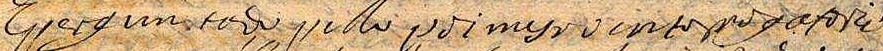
E perguntado pello primejro interrogatorio
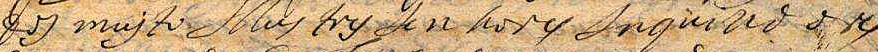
dos muito Illustres senhores Inquizidores
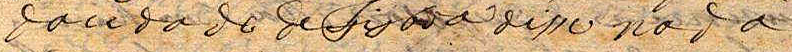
da cidade de Lisboa disse nada
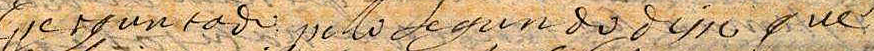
E perguntado pello segundo disse que
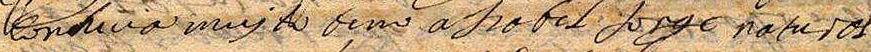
conhecia mujto bem a Jzabel Jorge natural
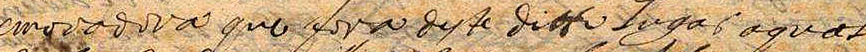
e moradora que fora deste ditto Lugar a quaL
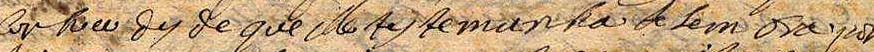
conhece desde que elle testemunha se lembra por
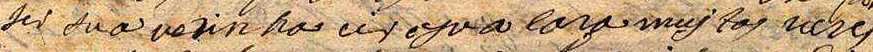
ser sua uezinha e ir a sua caza mujtas uezes
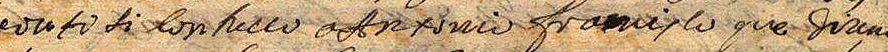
e outosi conheceo a Antonio francisco que dizem
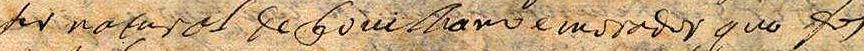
ser natural de Couilham e morador que foj
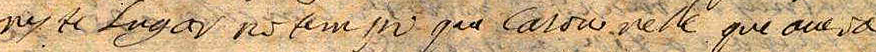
neste Lugar no tempo que cazou nelle que auera
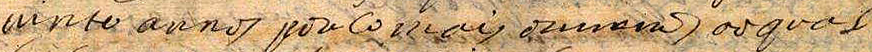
uinte annos pouco mais ou menos ao qual
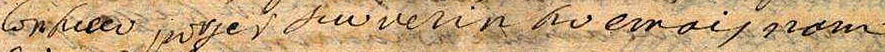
conheceo por ser seu uezinho e mais nam
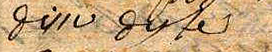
disse deste
